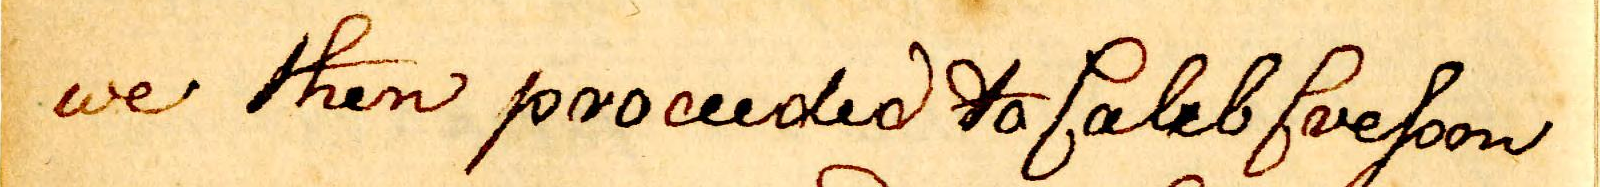we then proceeded to Caleb Cresson
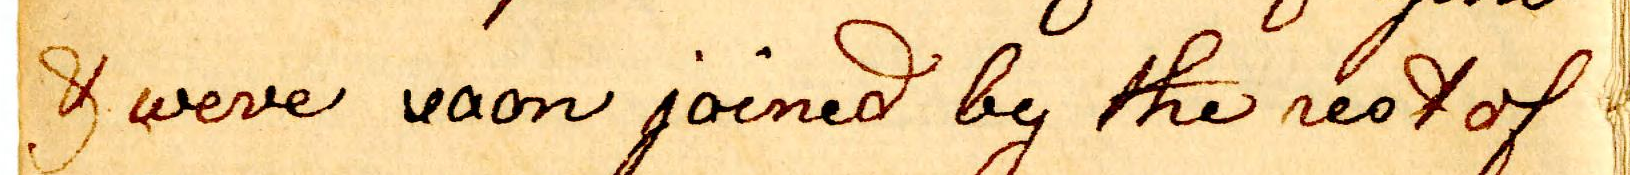& were soon joined by the rest of
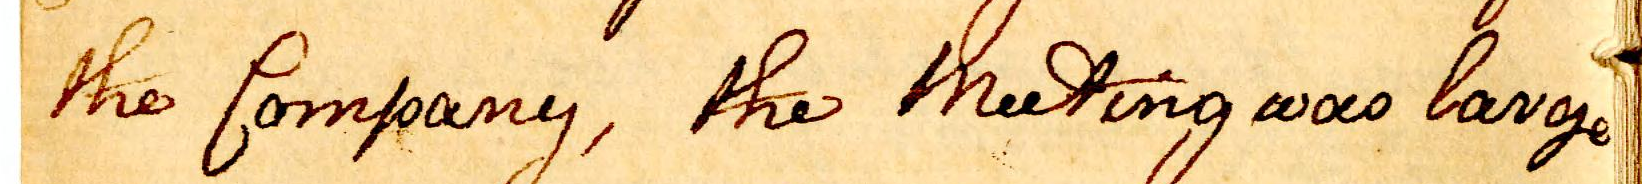the Company, the Meeting was large
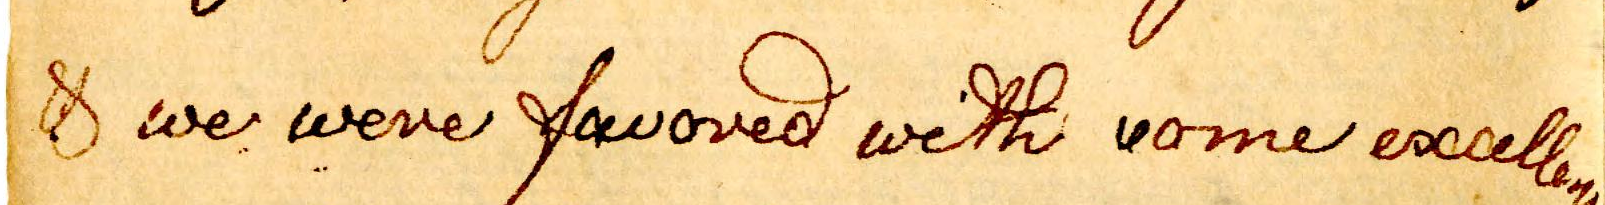& we were favored with some excellen
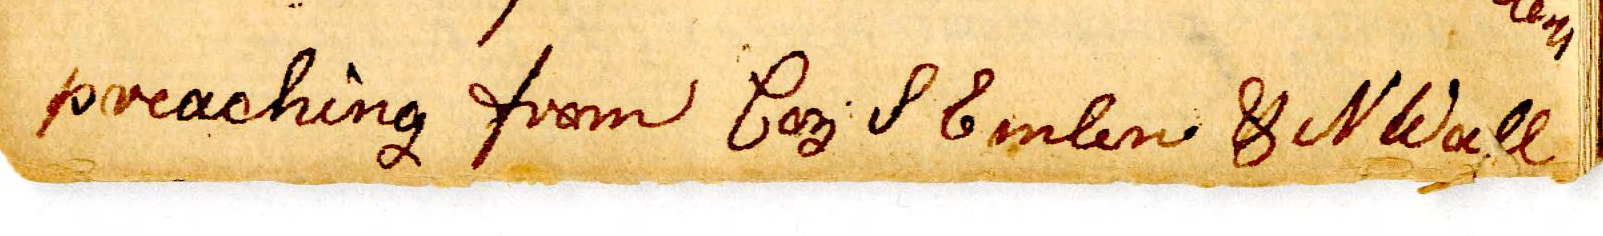preaching from Coz S Emlen & N Wall
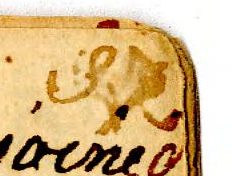37
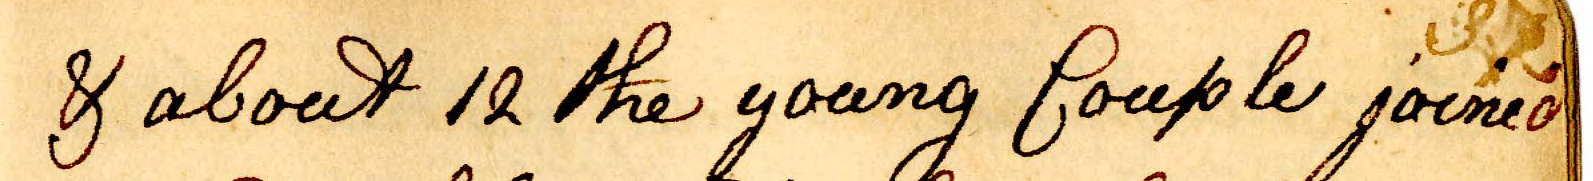& about 12 the young Couple joined
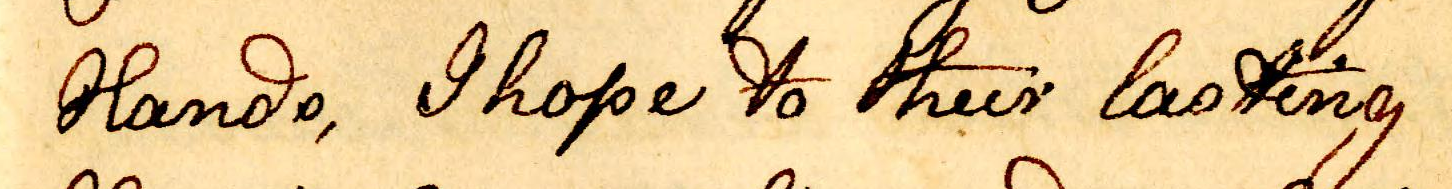Hands, I hope to their lasting
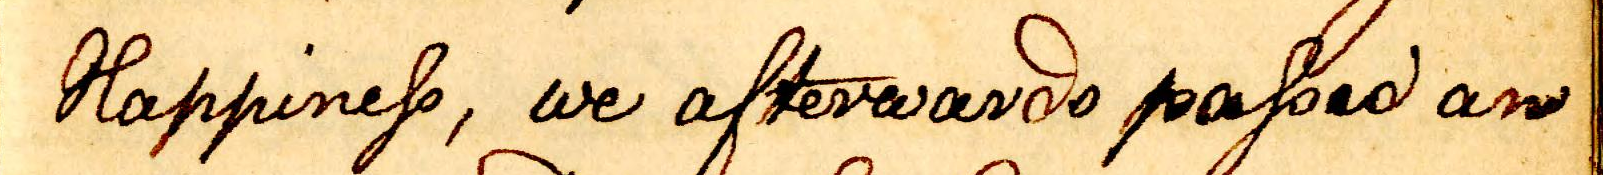Happiness, we afterwards passed an
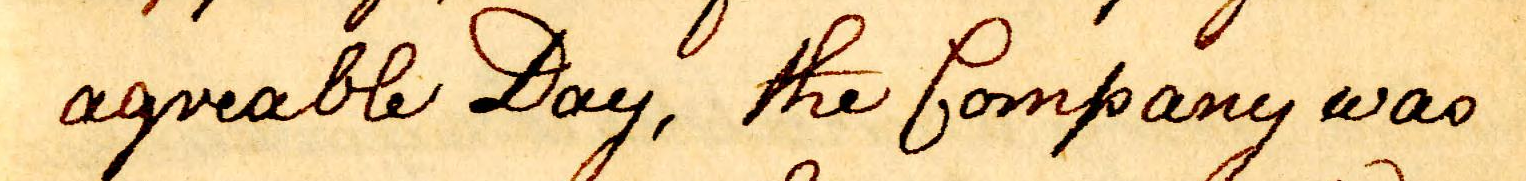agreable Day, the Company was
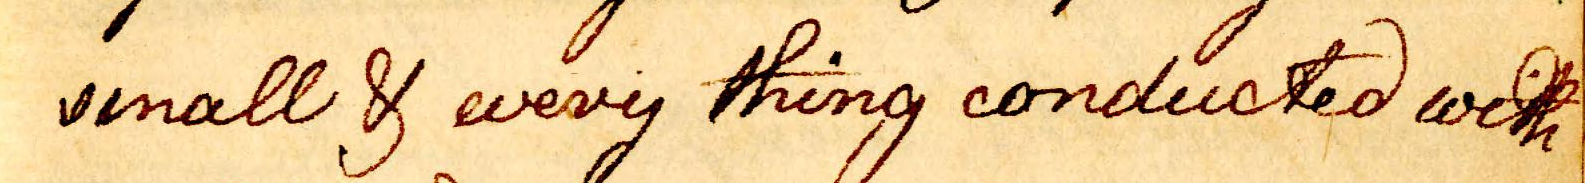small & every thing conducted with
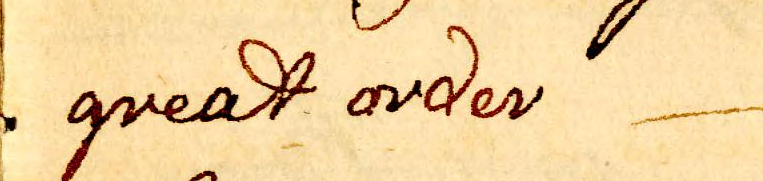great order
